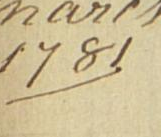1781
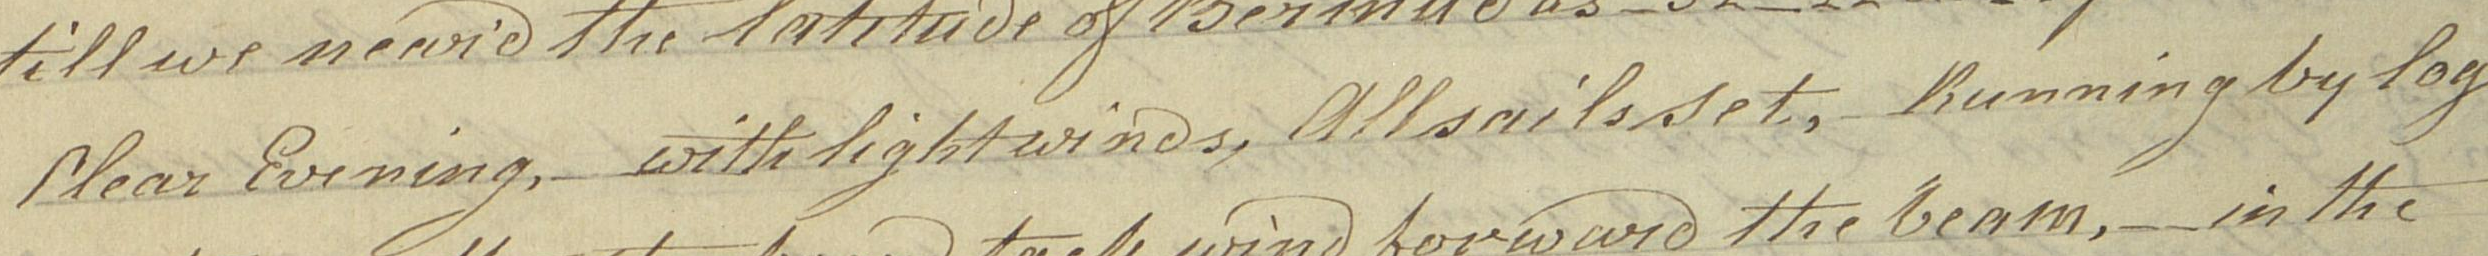Clear Evening, with Light winds, All sails set, Running by log
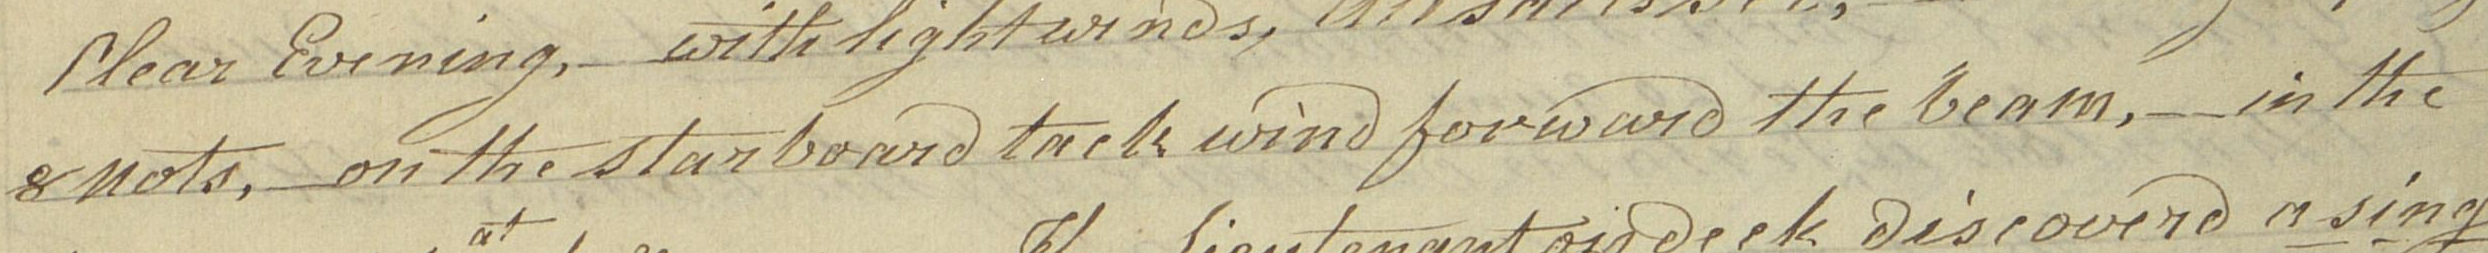8 mots, on the starboard tack wind forward the beam, in the
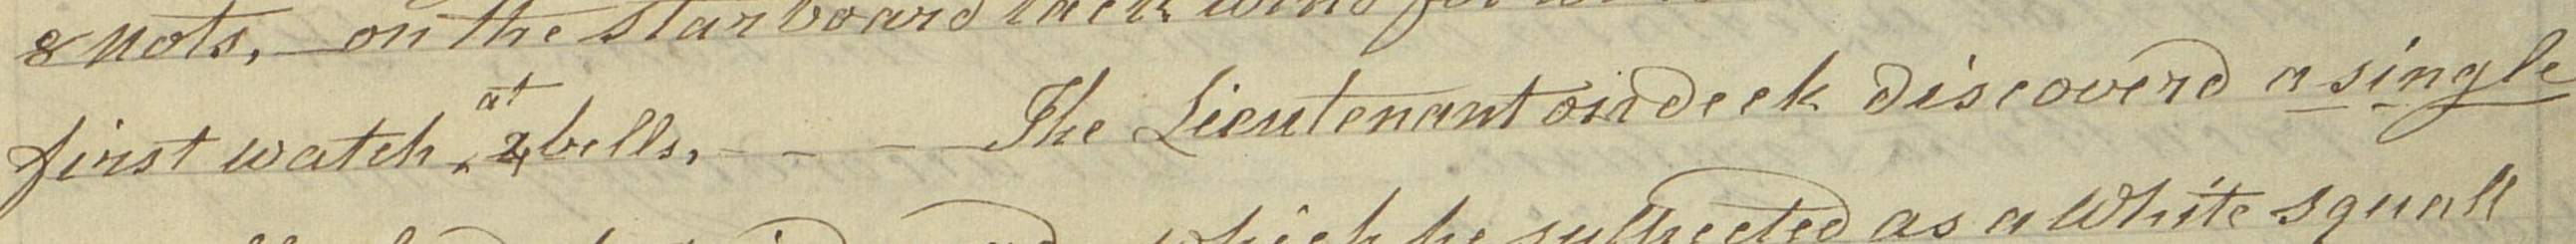first watch ^ 4 bells.- The Lieutenant on deck discoverd a single
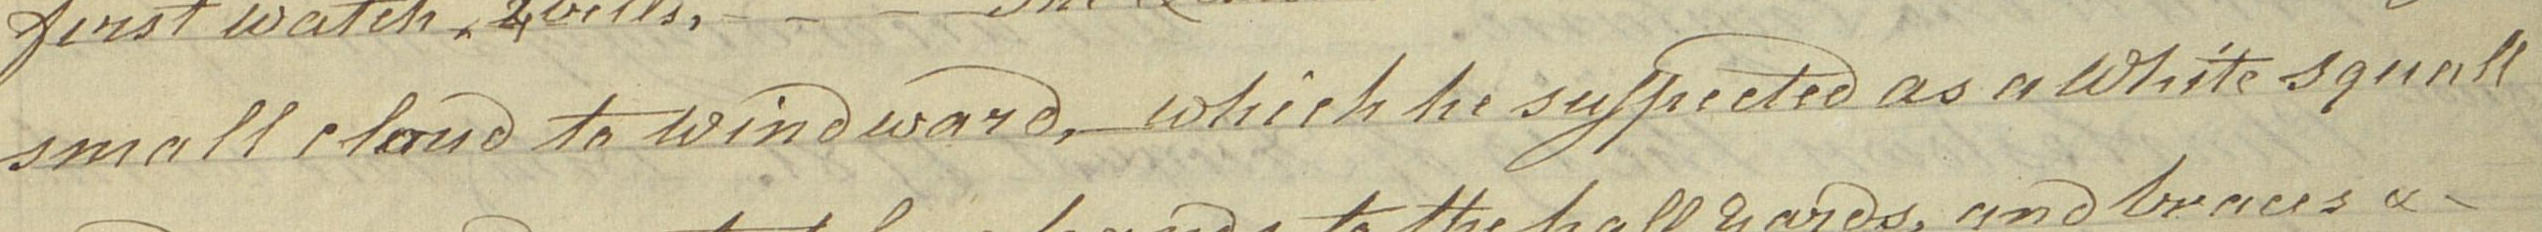small cloud to windward, which he suspected as a White squall
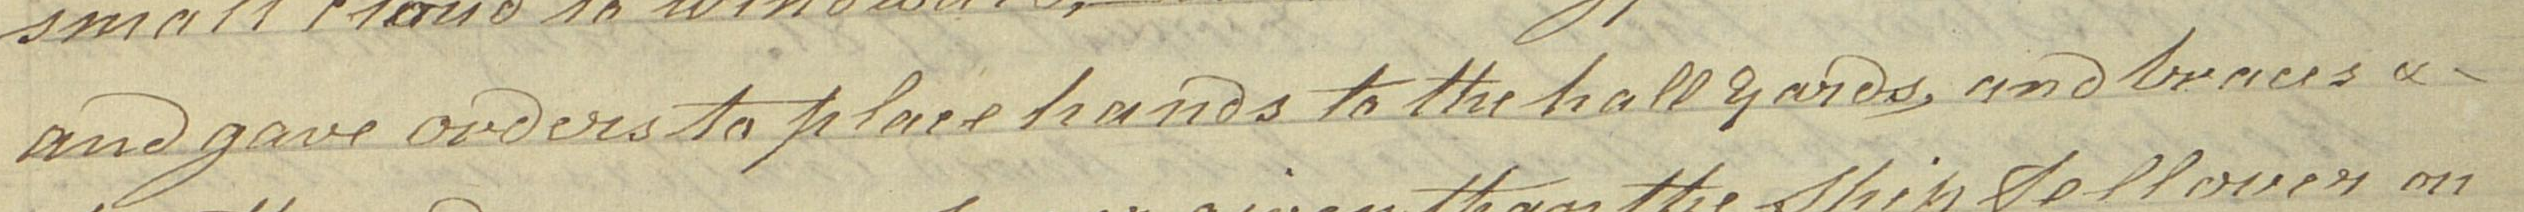and gave orders to place hands to the hall Yards, and braces a
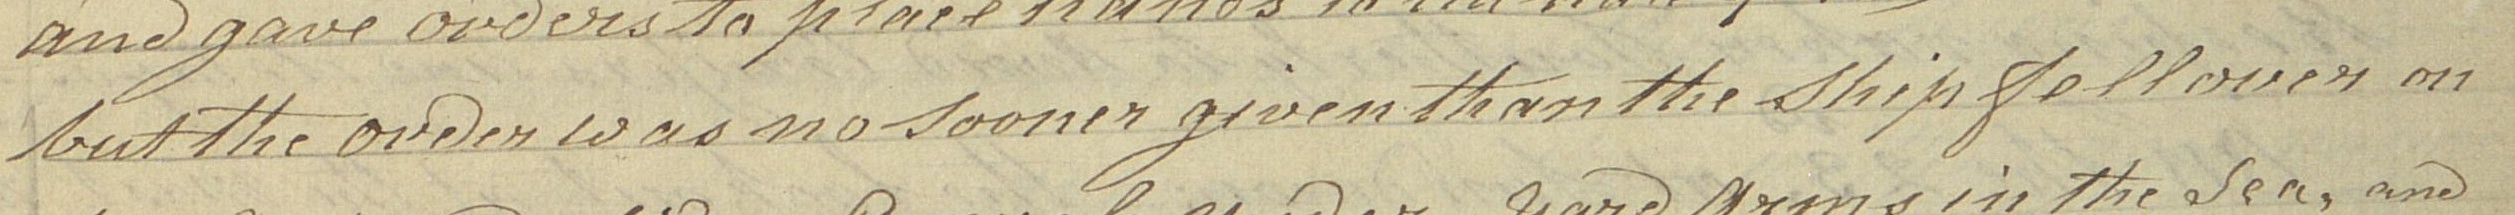but the order was no sooner given than the Ship follower on
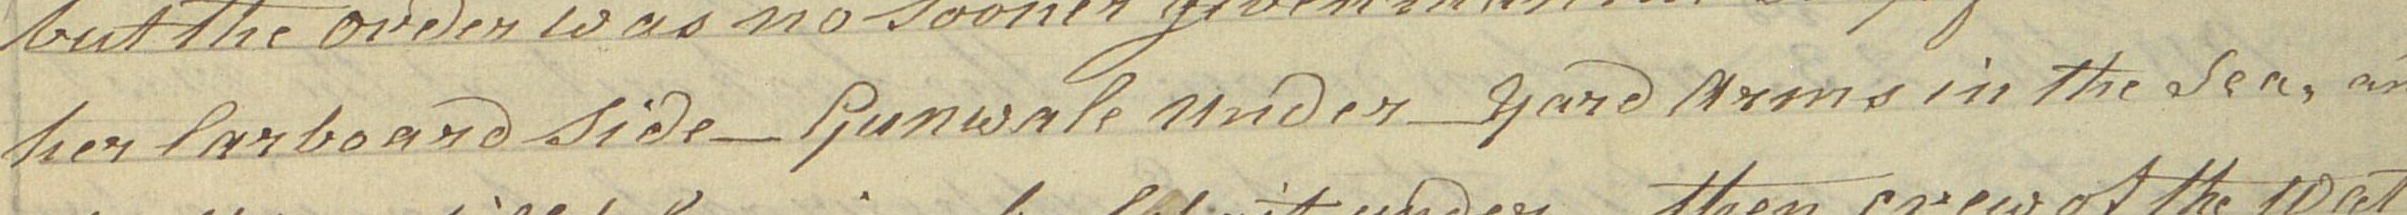her Carboard Side, Gunwale Under, Yard Arms in the Sea, and
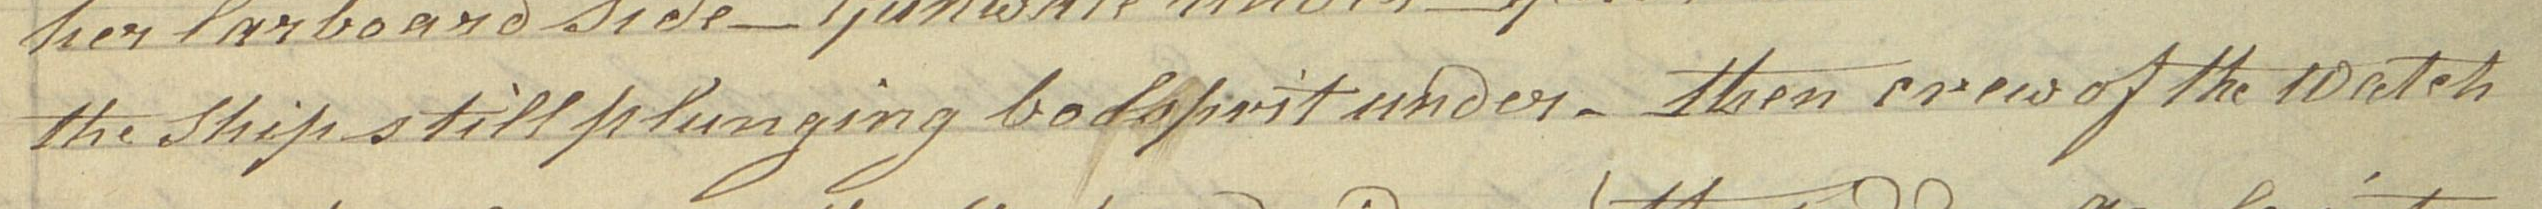the Ship still plunging bossprit under, then crew of the Watch
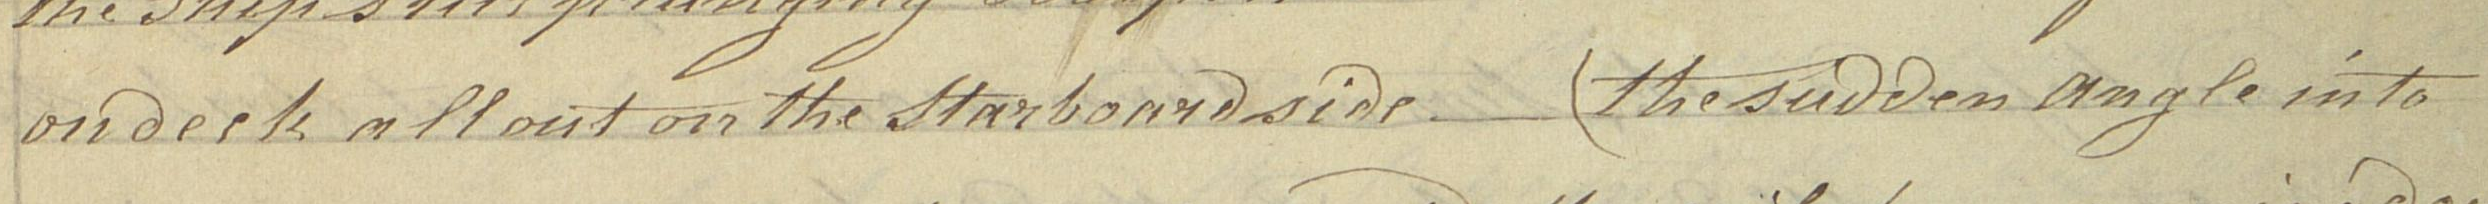on deck all out on the starboardside. (The sudden angle into
